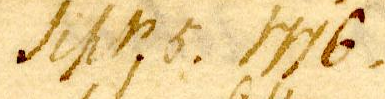Sep^r. 5. 1776.
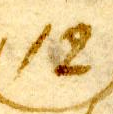12
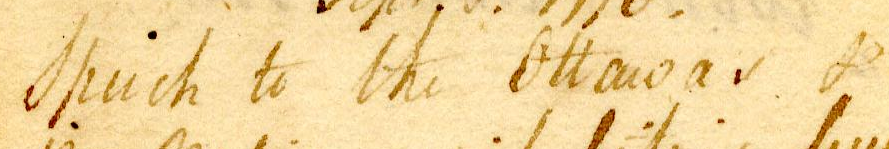Speech to the Ottawas &
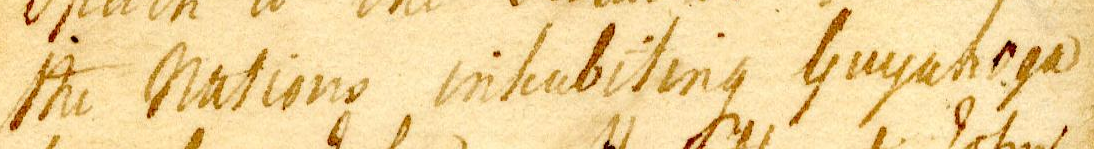the Nations inhabiting Cuyahoga
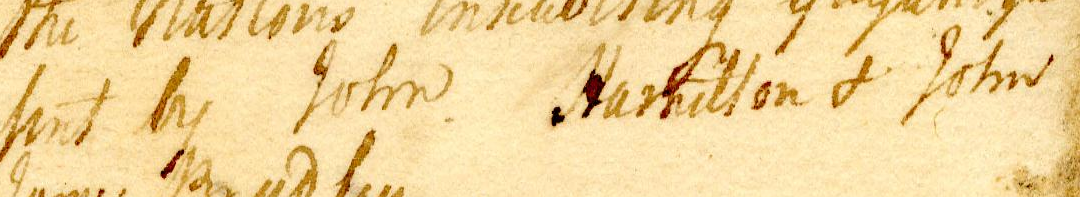sent by John Hamilton & John
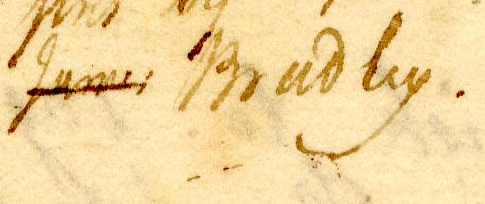James Bradley.-
